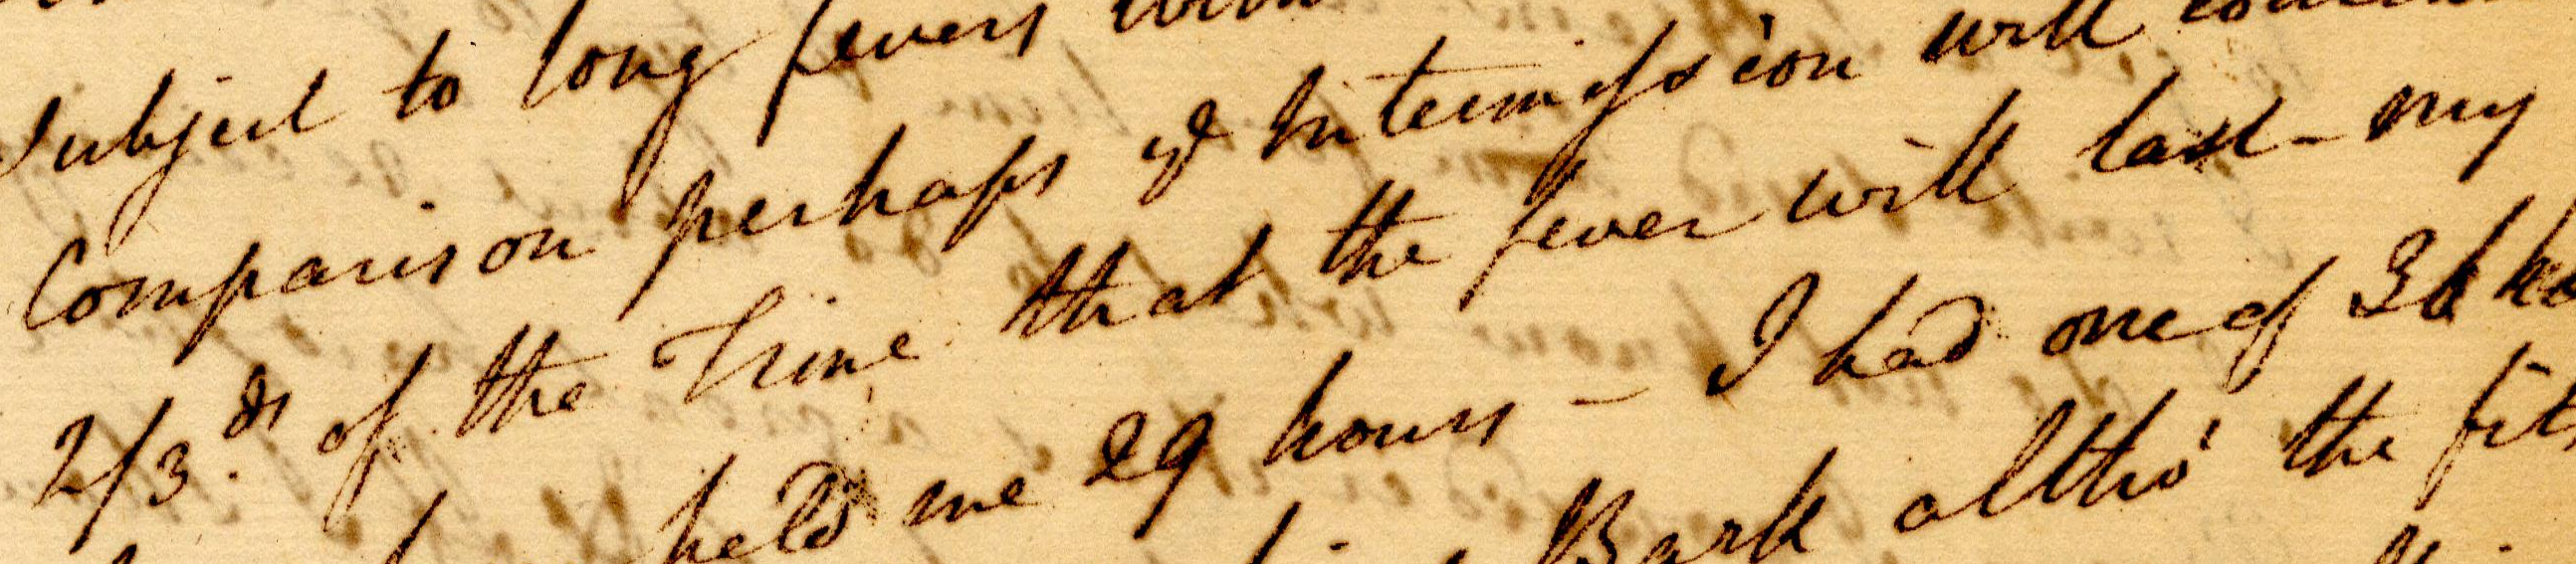2/3^d of the Time that the fever will last. My
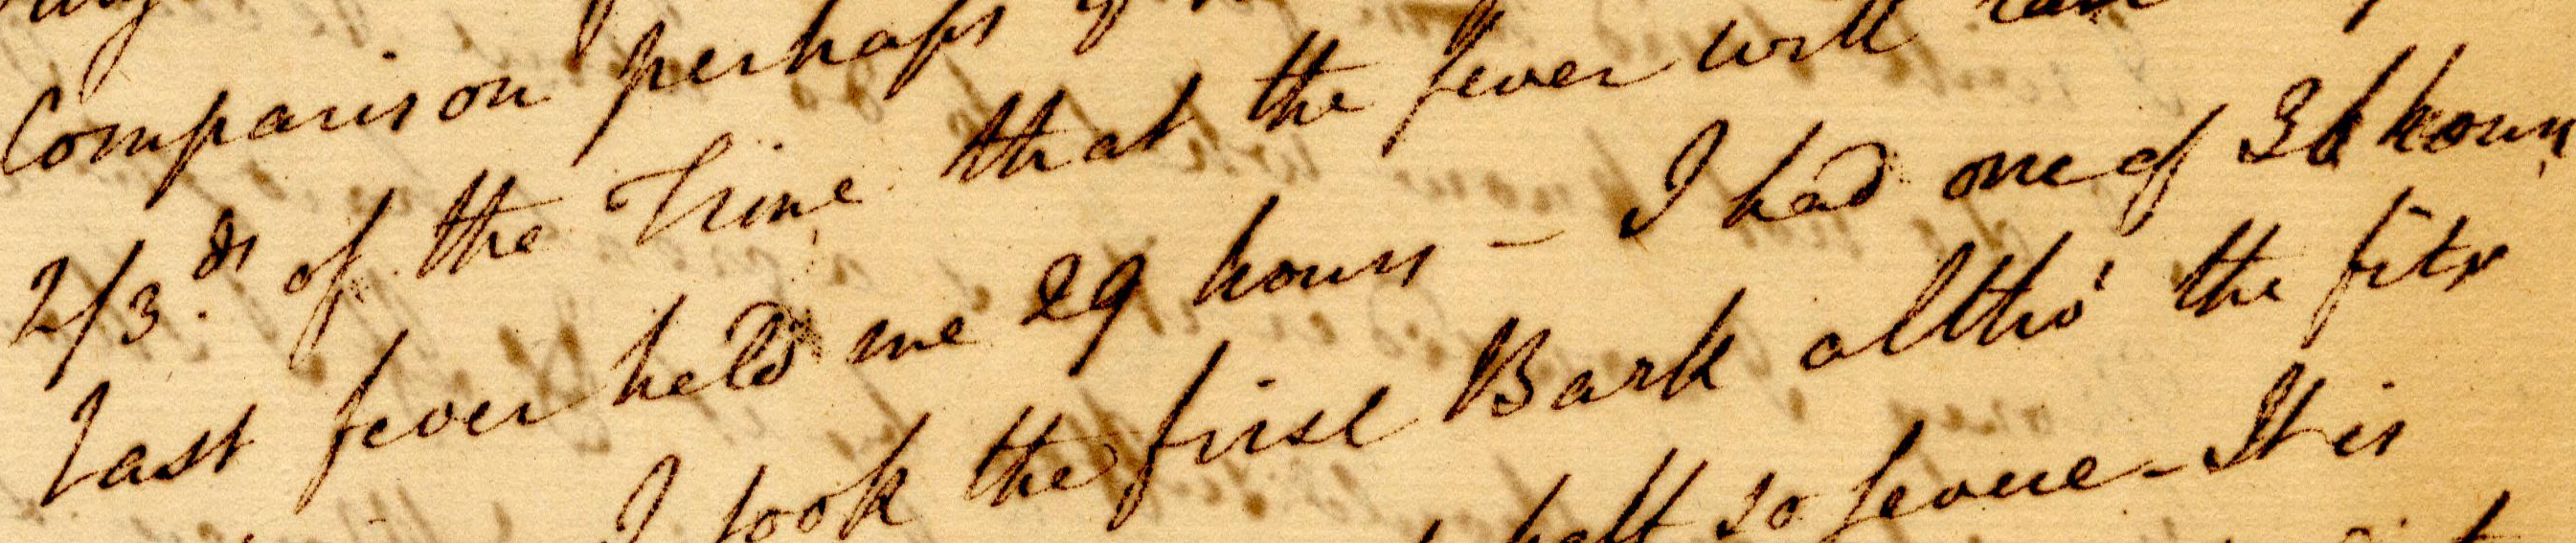last fever held me 29 hours- I had one of 36 known
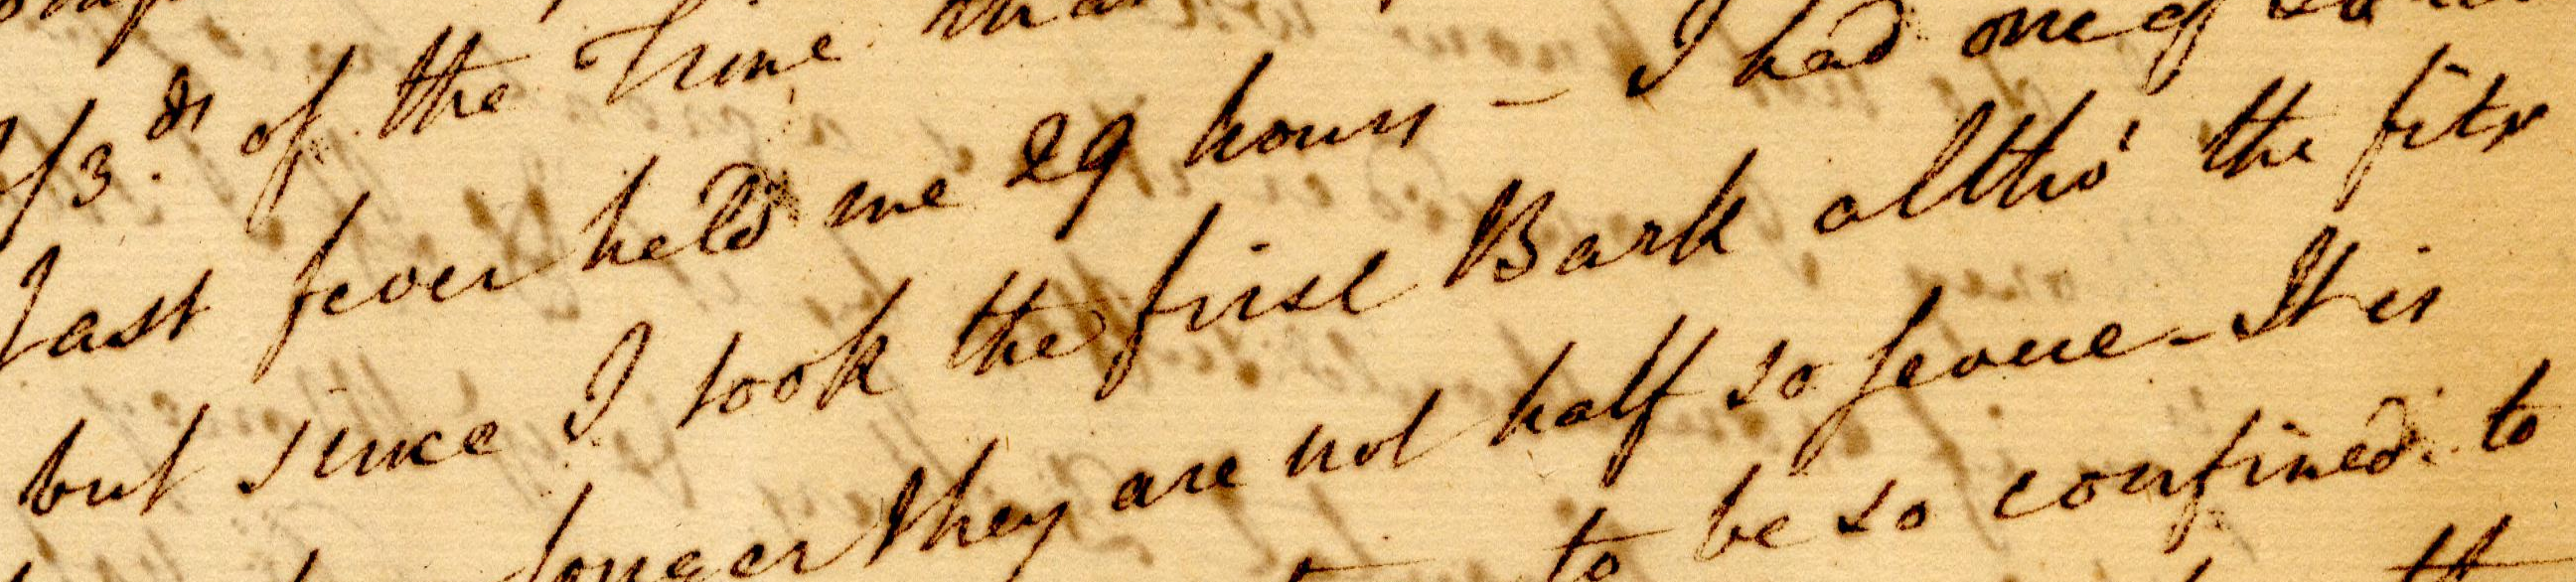but since I took the five Bark altho' the fits
